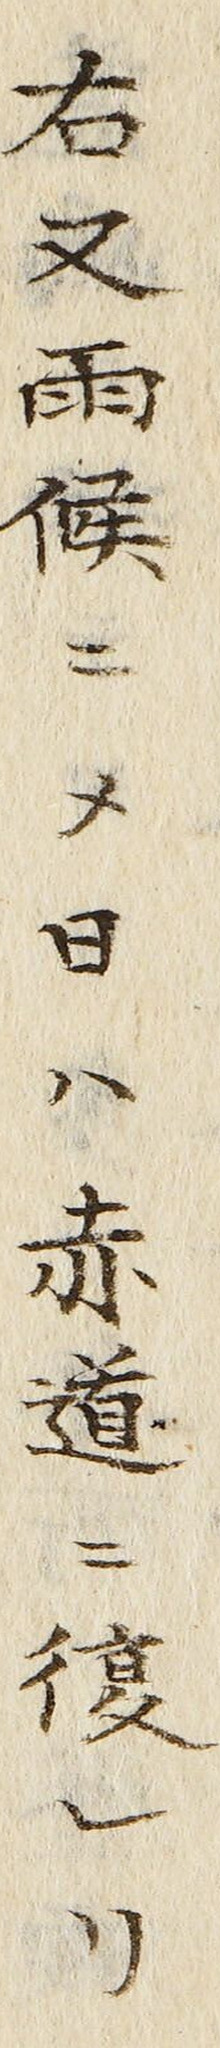右又雨候ニシテ日ハ赤道ニ復レリ
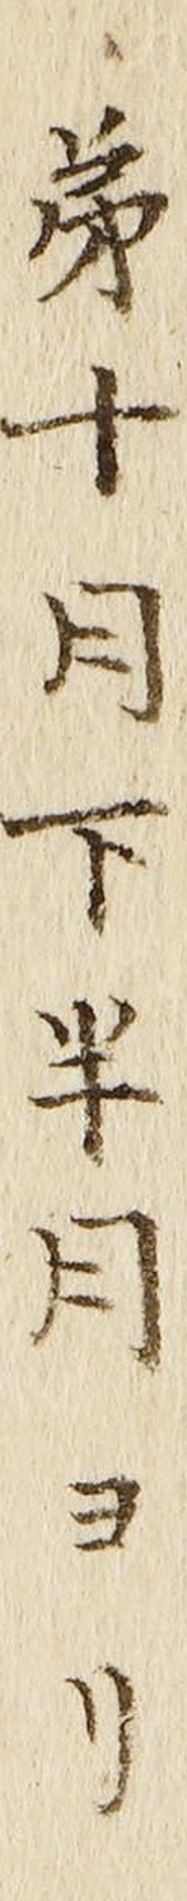第十月下半月ヨリ
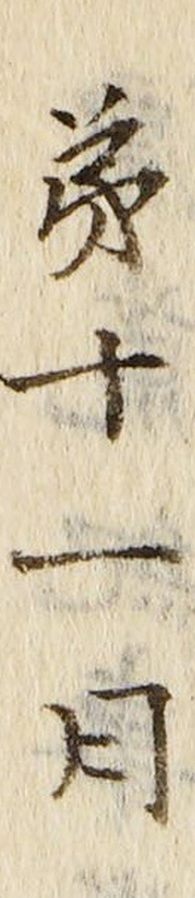第十一月
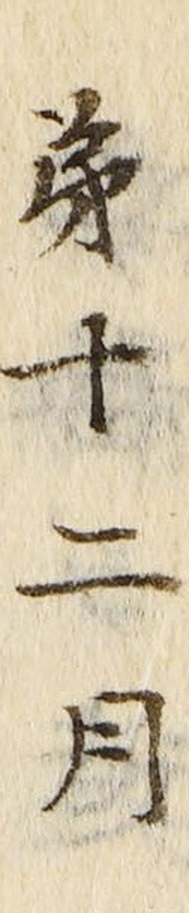第十二月
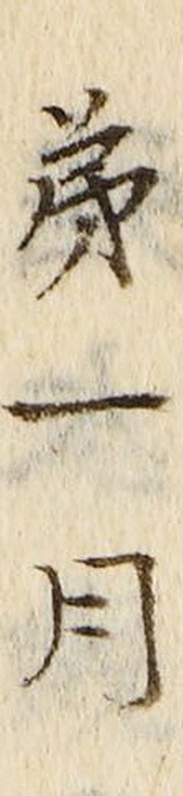第一月
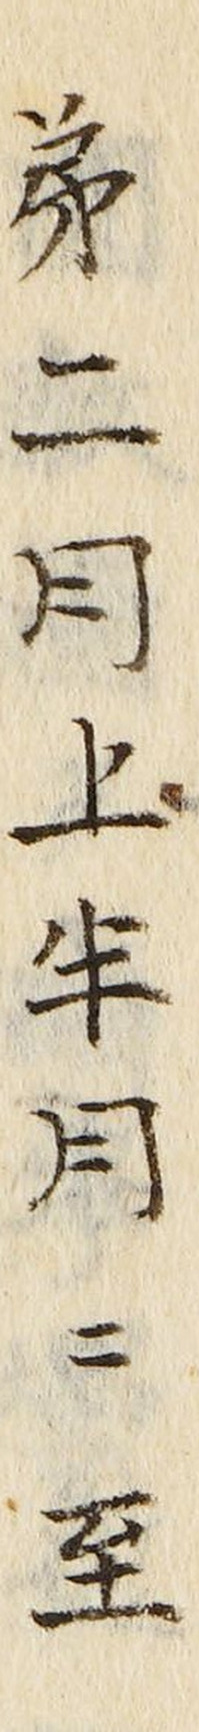第二月上半月ニ至
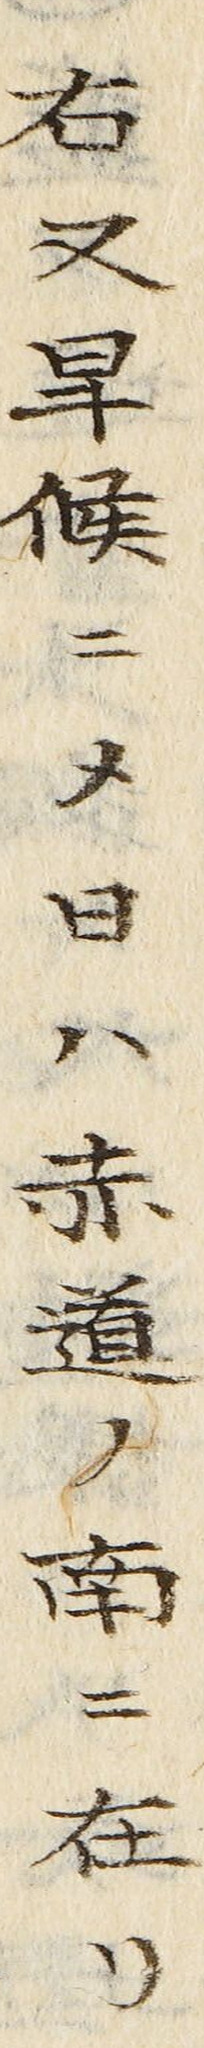右又旱候ニシテ日ハ赤道ノ南ニ在リ
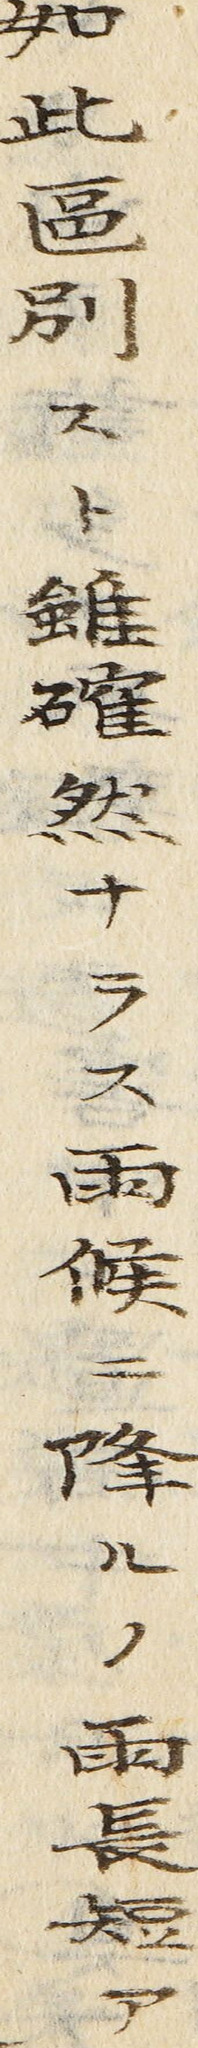如此区別スト雖確然ナラス雨候ニ降ルノ雨長短ア
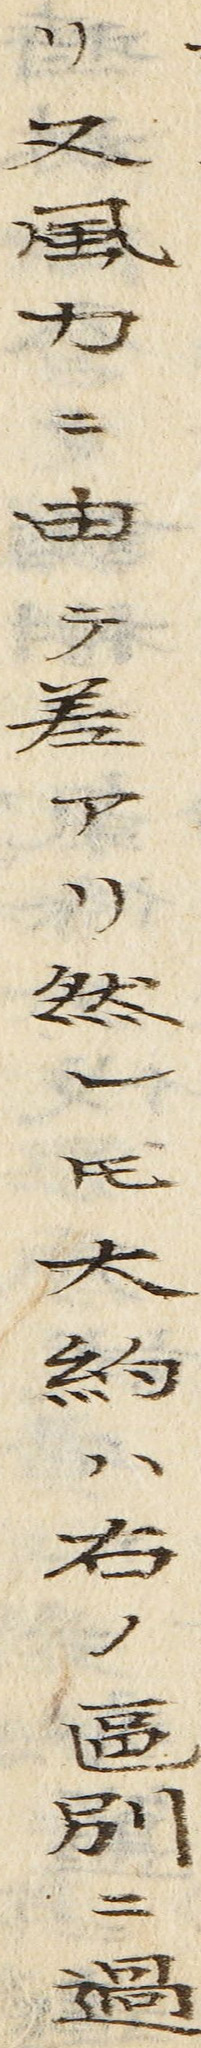リ又風力ニ由テ差アリ然レトモ大約ハ右ノ区別ニ過
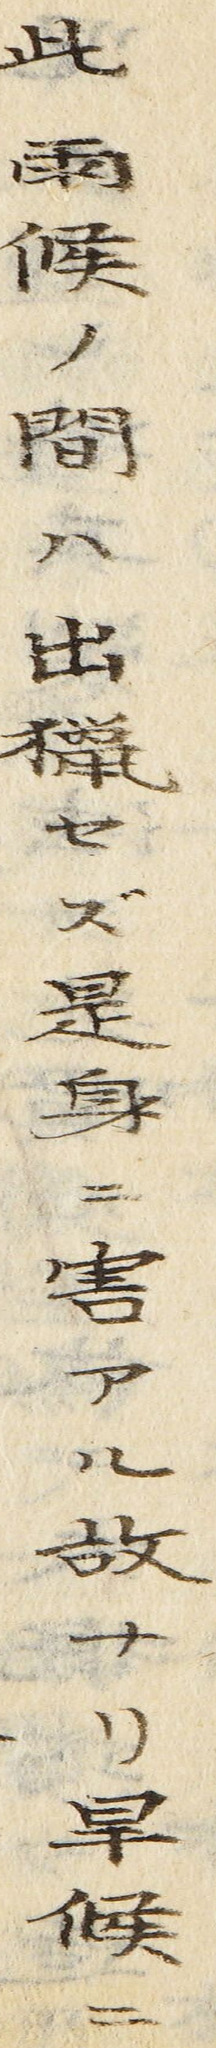此雨候ノ間は出猟セズ是身ニ害アル故ナリ旱候ニ
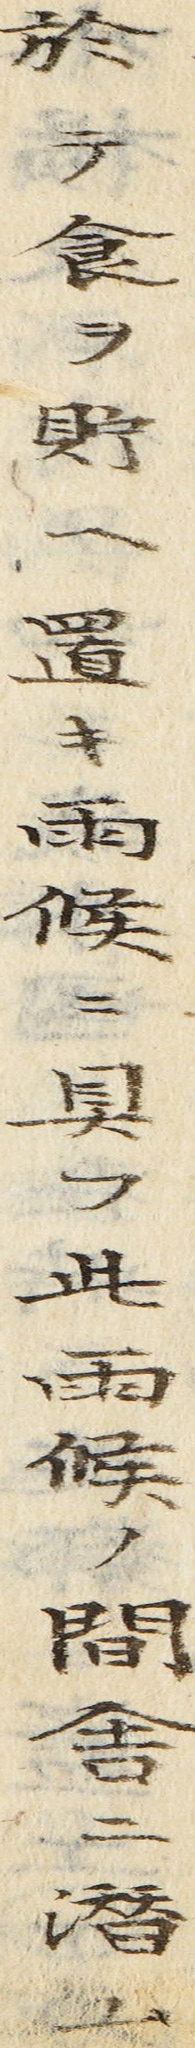於テ食ヲ貯ヘ置キ雨候ニ具フ此雨候ノ間舎ニ潜ム
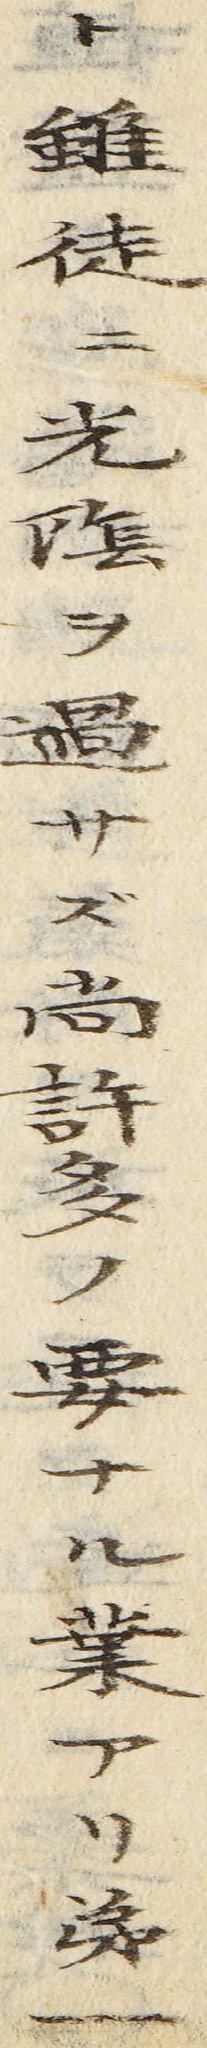ト雖徒ニ光陰ヲ過サズ尚許多ノ要ナル業アリ第一
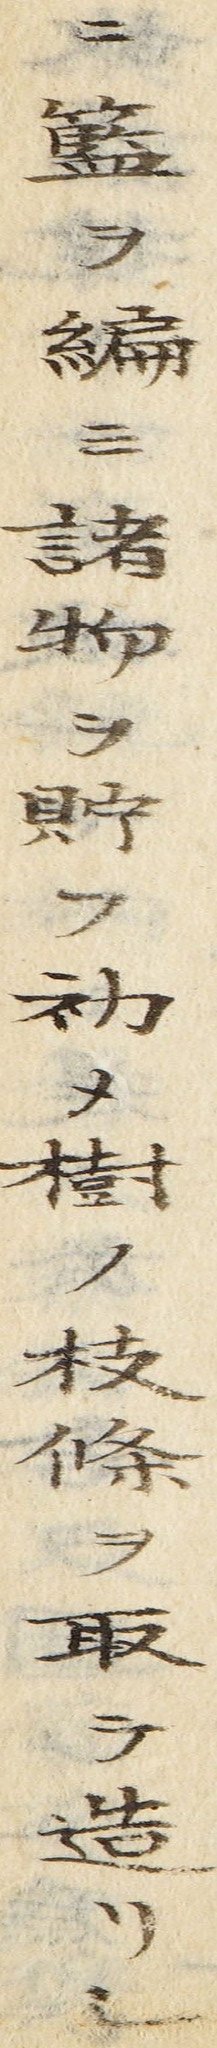ニ籃ヲ編ミ諸物ヲ貯フ初メ樹ノ枝條ヲ取テ造リシ

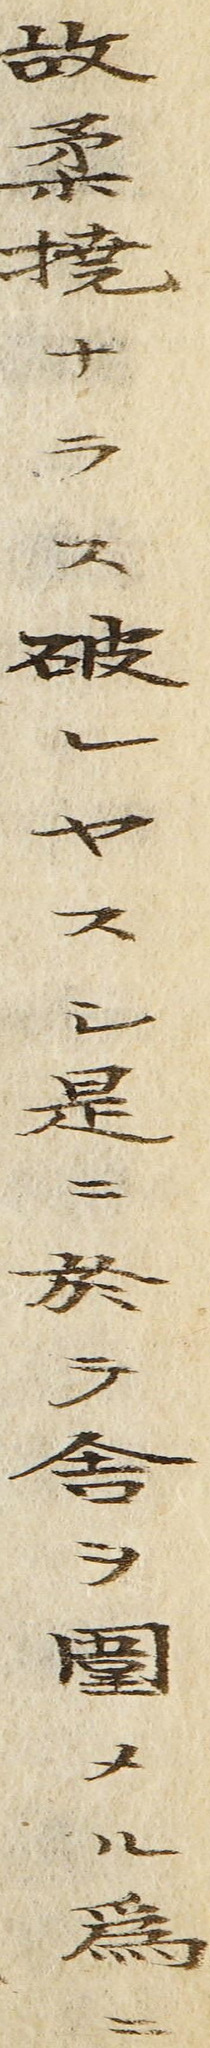故柔撓ナラス破レヤスシ是ニ於テ舎ヲ囲メル為ニ
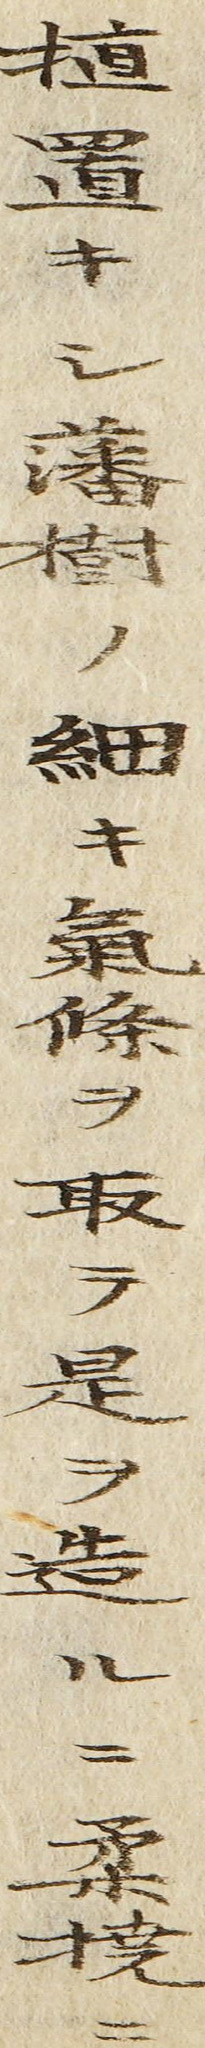植置キシ藩樹ノ細キ気條ヲ取テ是ヲ造ルニ柔撓ニ
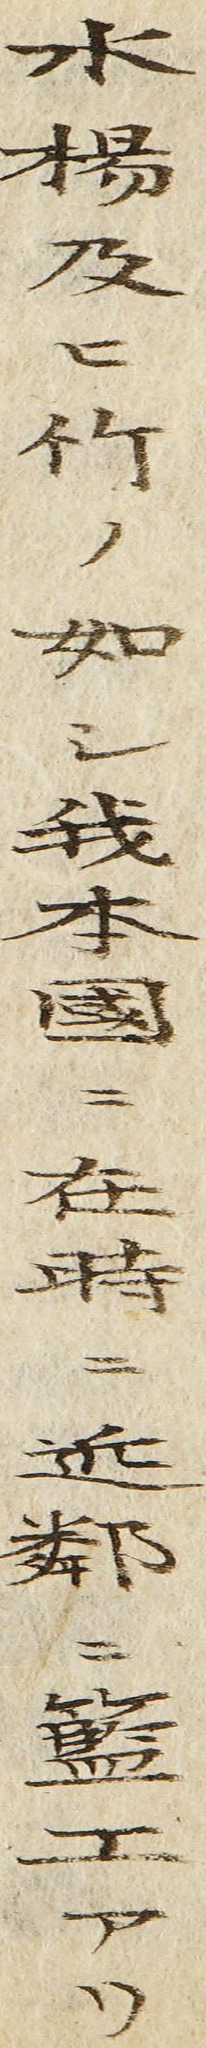水楊及ヒ竹ノ如シ我本国ニ在時ニ近隣ニ籃工アリ
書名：漂流紀事
